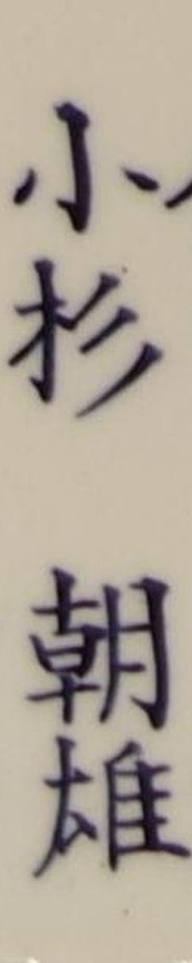小杉朝雄
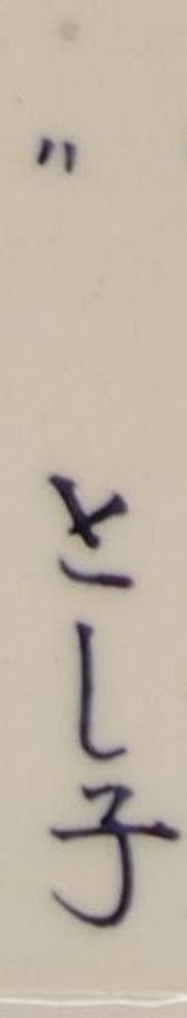とし子
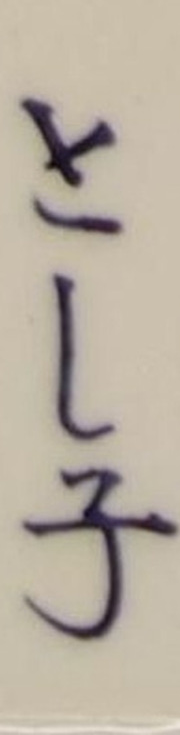とし子

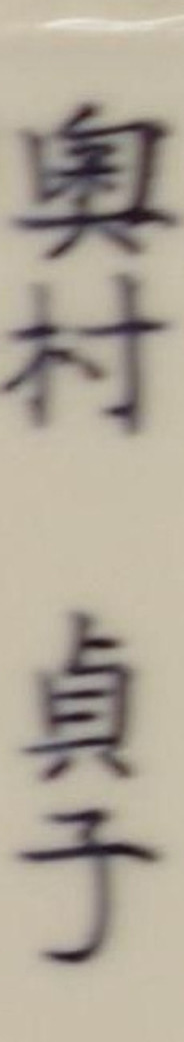奥村貞子
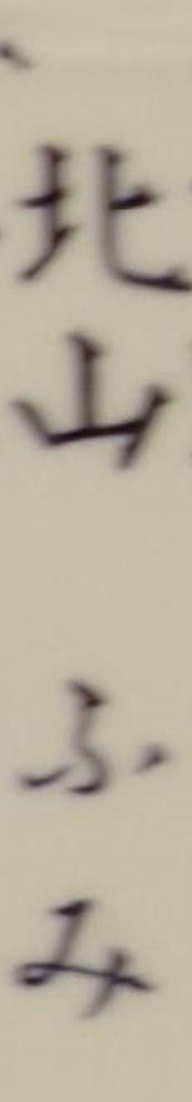北山ふみ
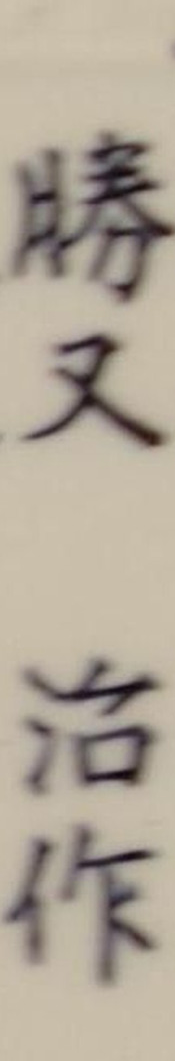勝又治作
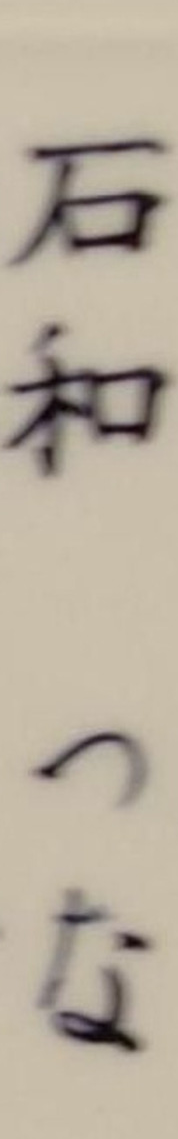石和つな
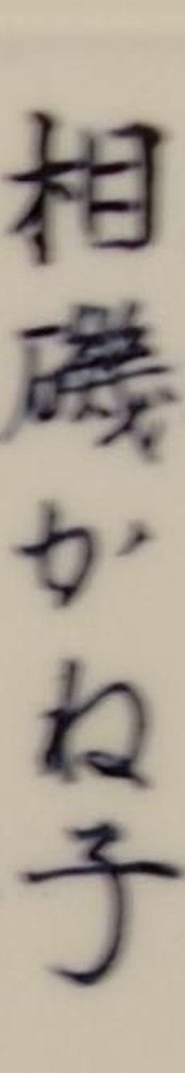相磯かね子
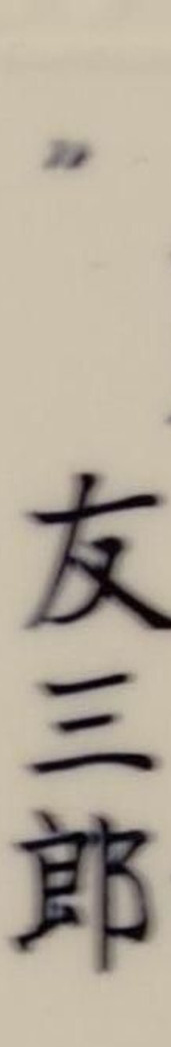友三郎
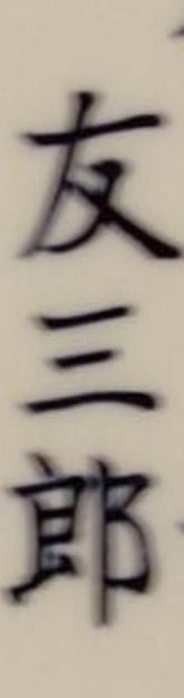友三郎
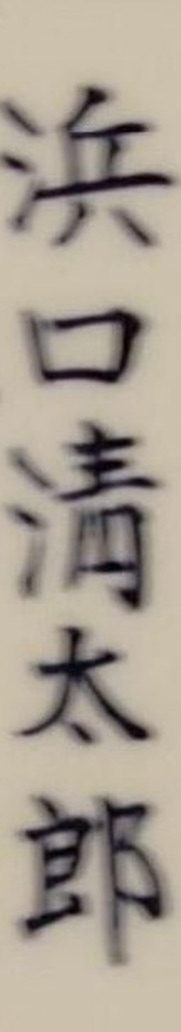浜口清太郎
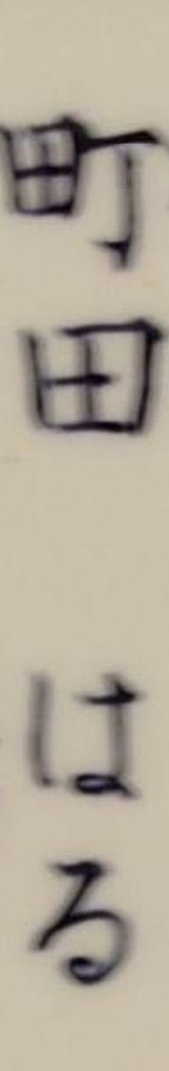町田はる
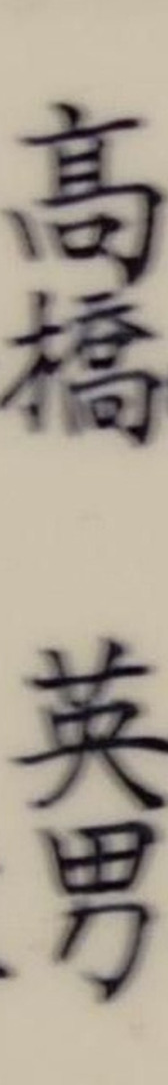高橋英男
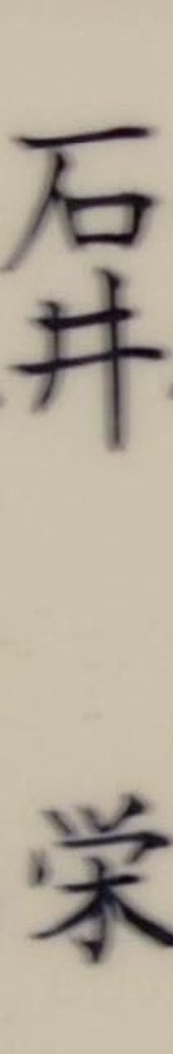石井栄
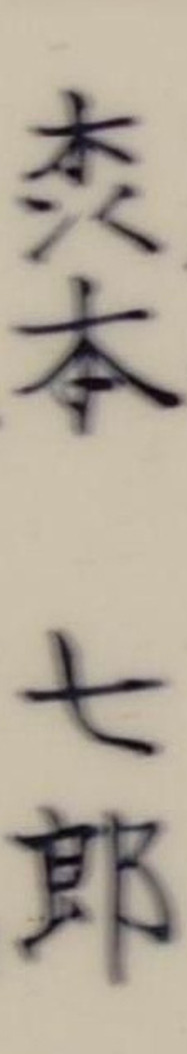森本七郎
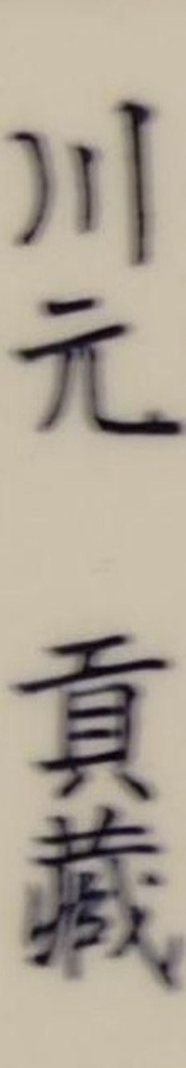川元貢蔵
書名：E~L
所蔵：高野山金剛峯寺
